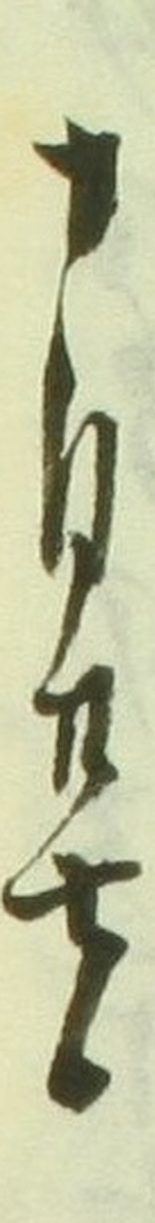十月廿七日
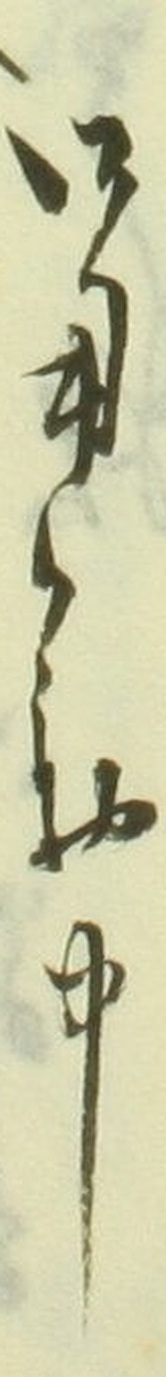御用勤中
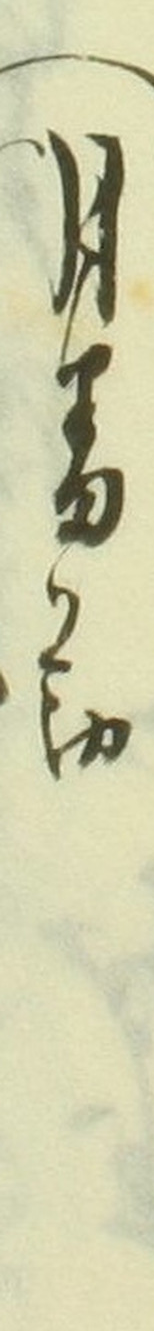月番勤
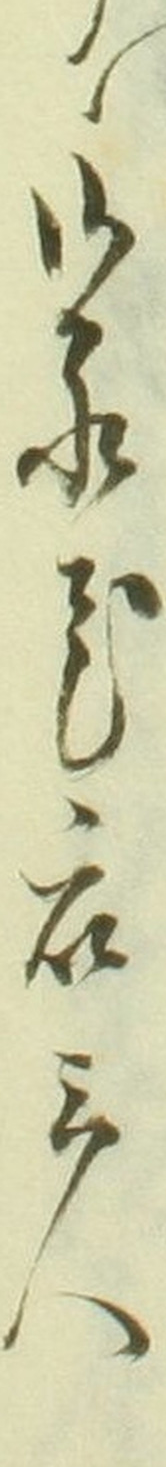御家老衆三人
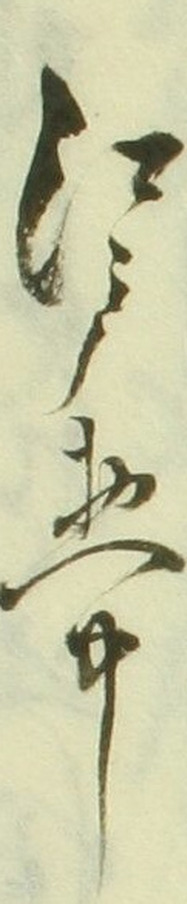江戸惣中
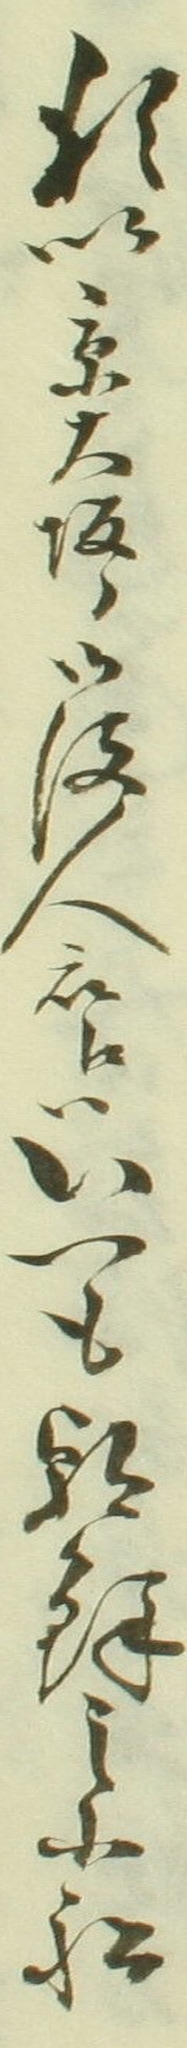猶以京大坂ノ御役人衆江ハいつも朝鮮之小船
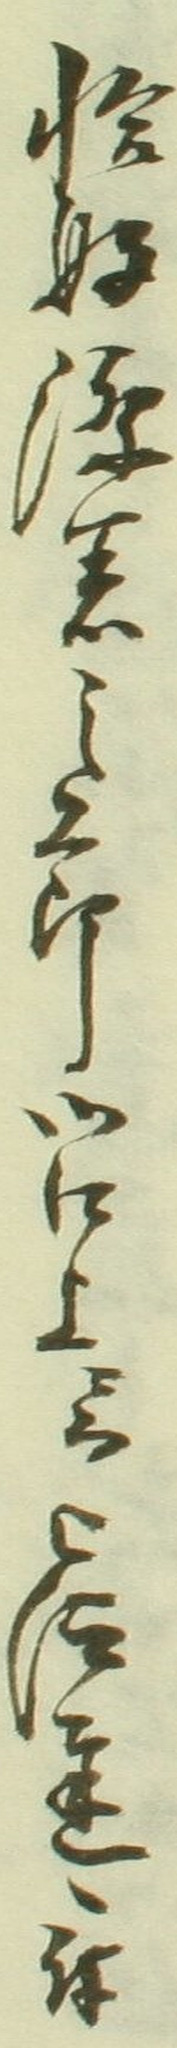恰好漂着之節御口上ニ而被仰達候付
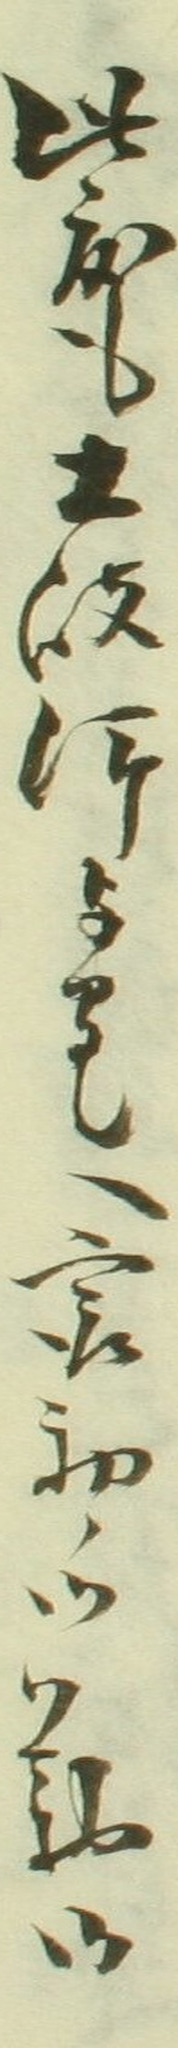此度も土岐伊予守殿へ最初ノ御勤御
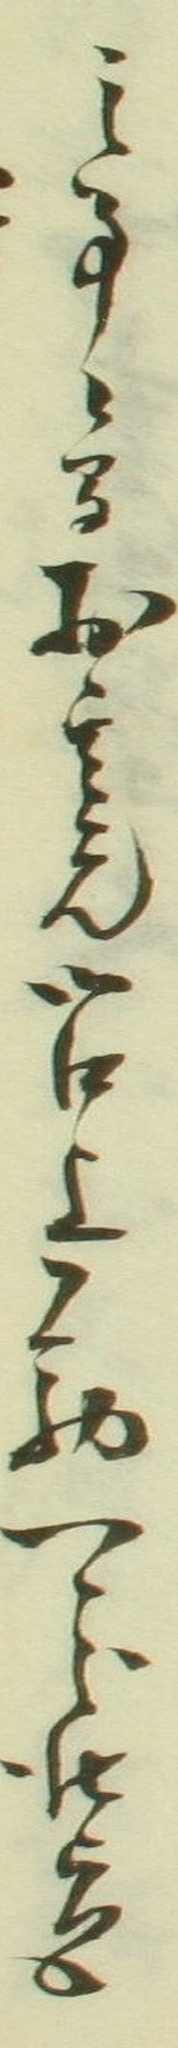之事候間於其元御口上勤可被仕旨候
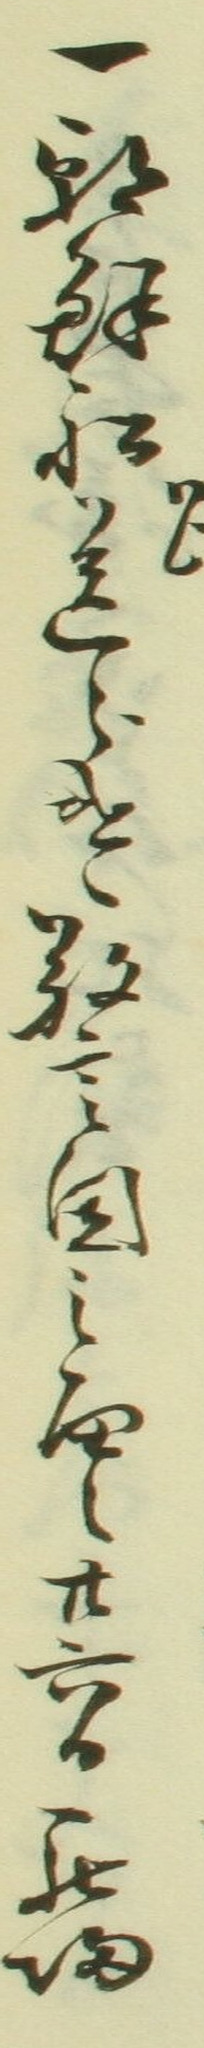一朝鮮船送被遣候警固之面々廿六日罷帰

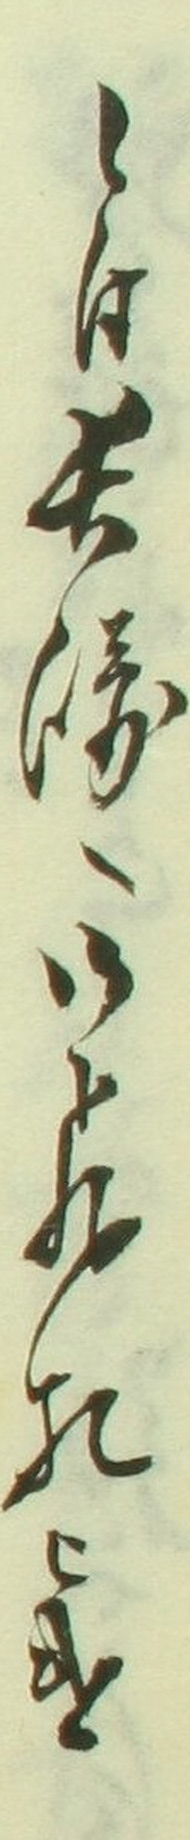候付長崎へ御飛札被遣
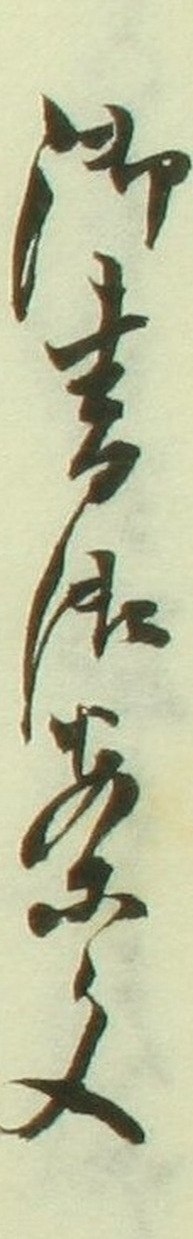御書御案文
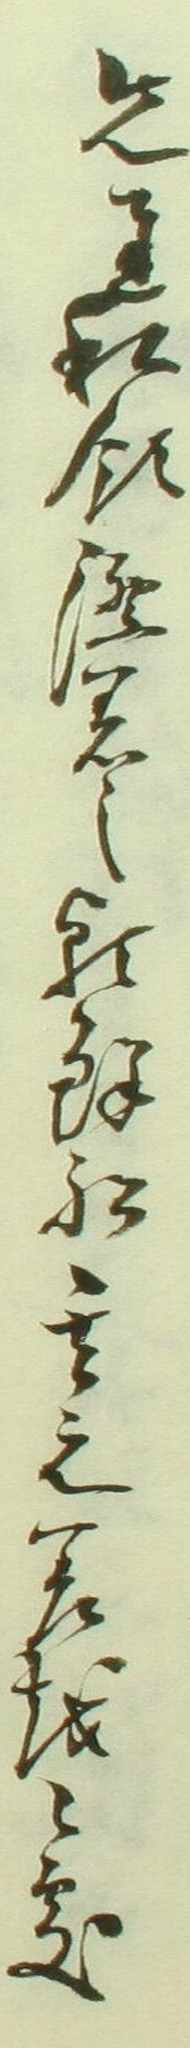先達私領漂着之朝鮮船其元差越候処
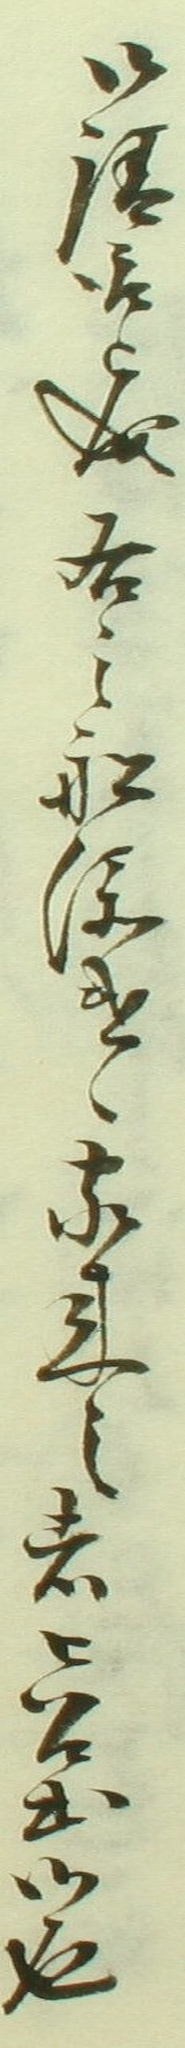御請取被成右之船添遣候家来之者被召出御返
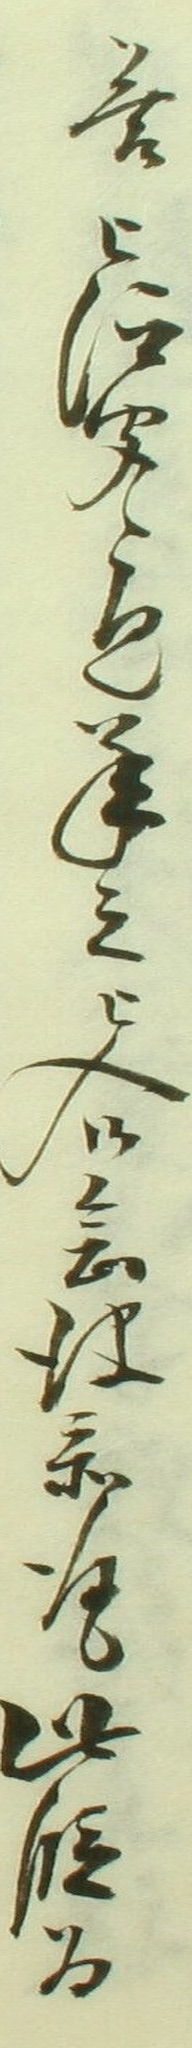答被仰聞候通承之被入御念儀忝存候此段為
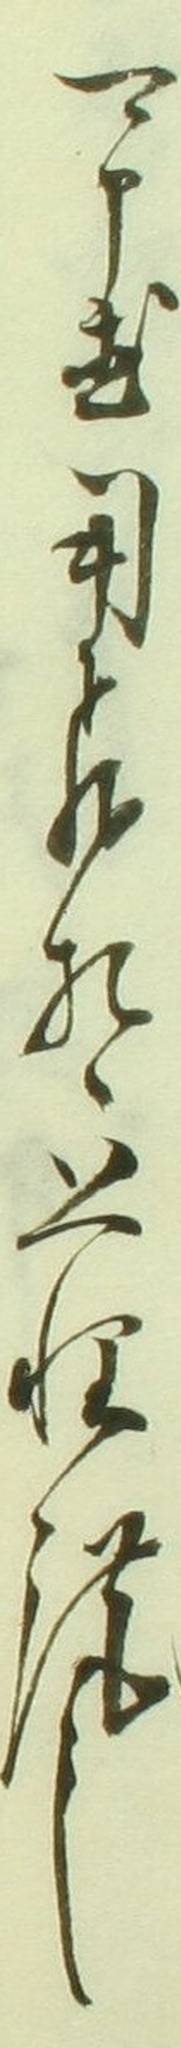可申置用飛札候恐惶謹言
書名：異国船漂着記
